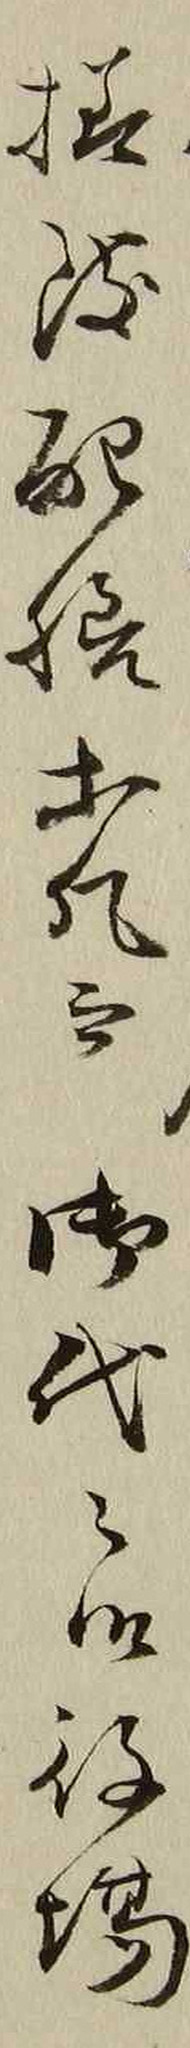様致配膳等凡而御代々御役場
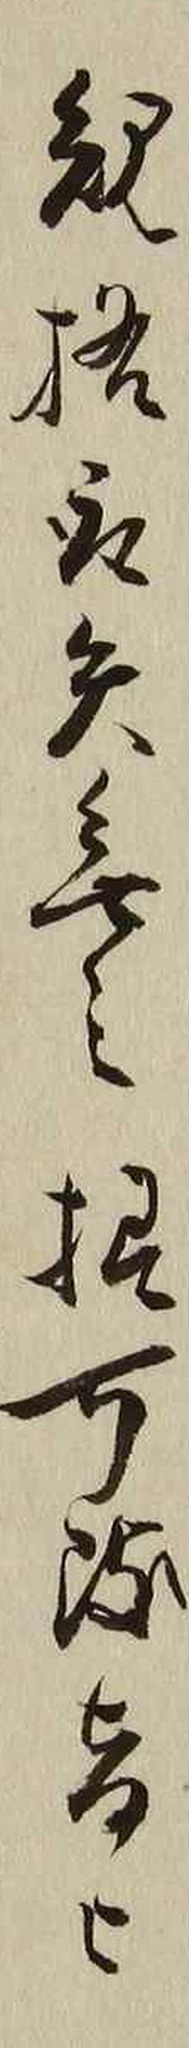規格取失無之様可致旨被
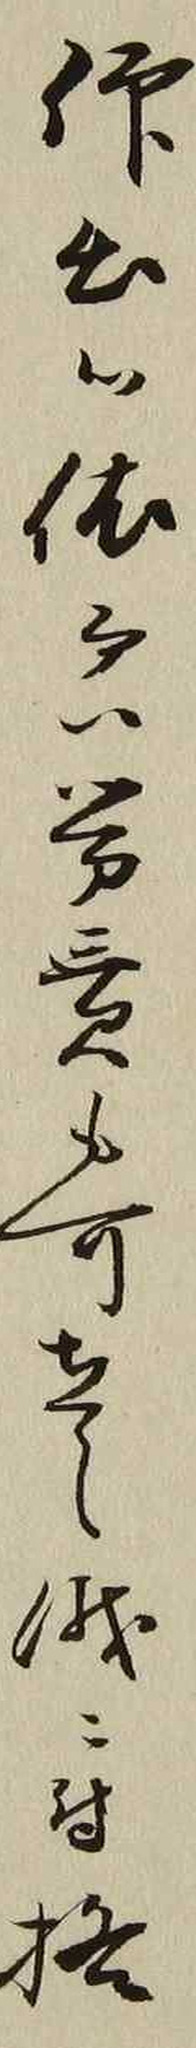仰出候依而は労費も可有之儀に付格
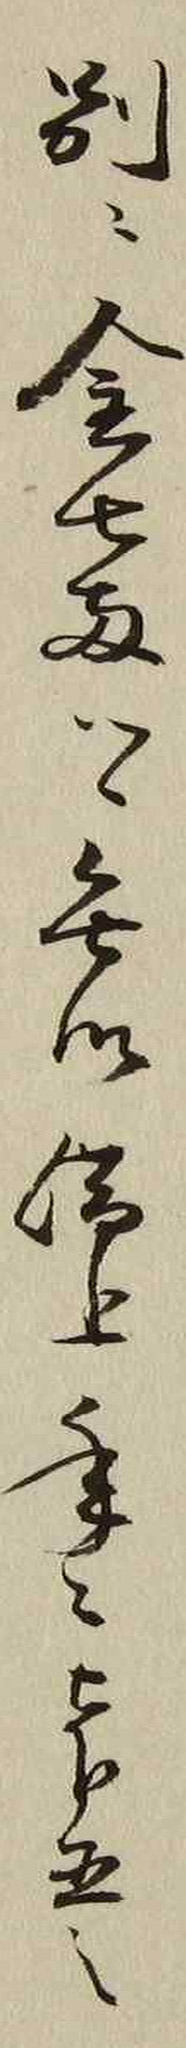別に金七両つゝ無御借上年々被下置之
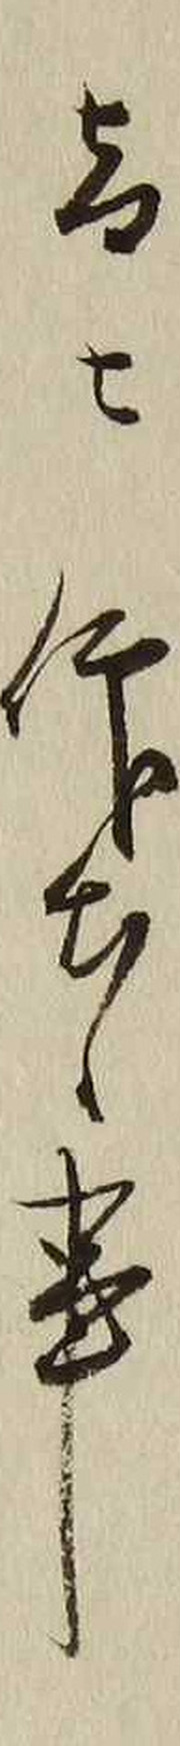旨被仰出候事
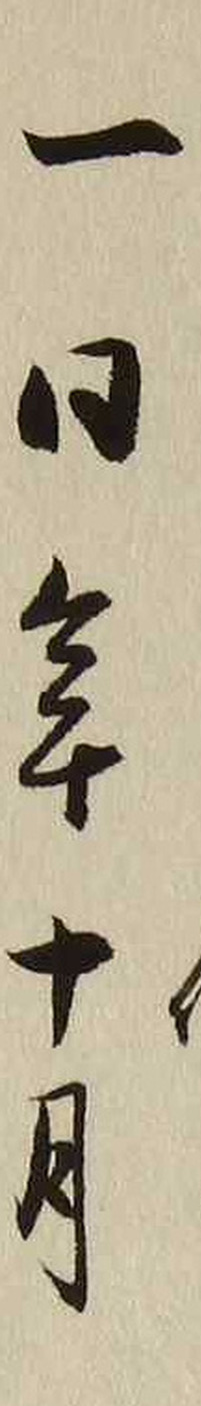一同年十月
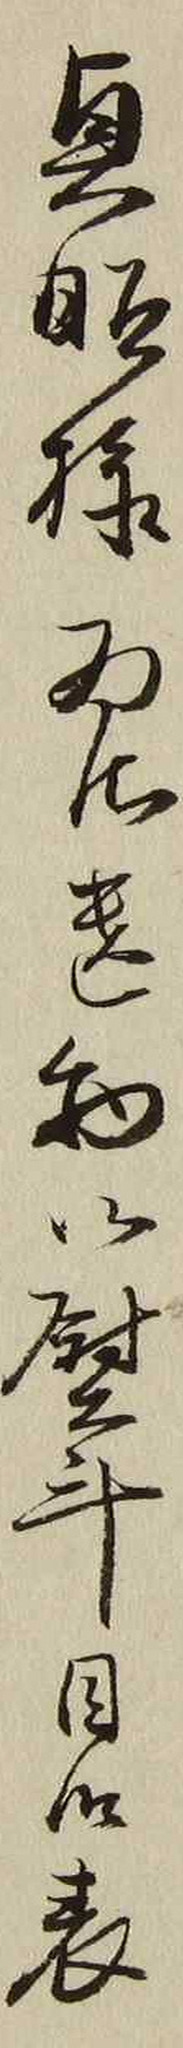貞昭様為御遺物御熨斗目御表
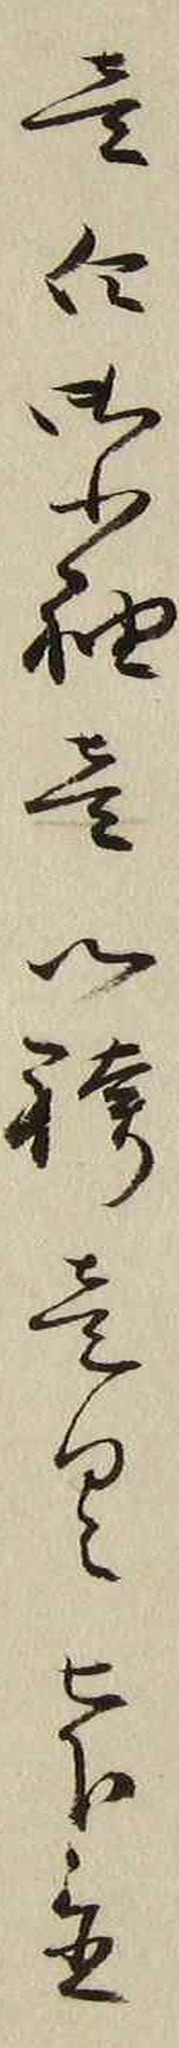壱白御小袖壱御袴壱具被下置
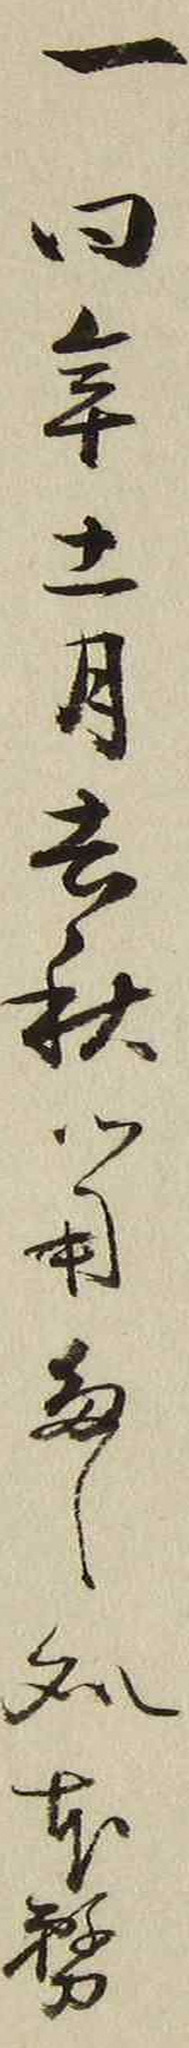一同年十一月去秋御用多之処本務
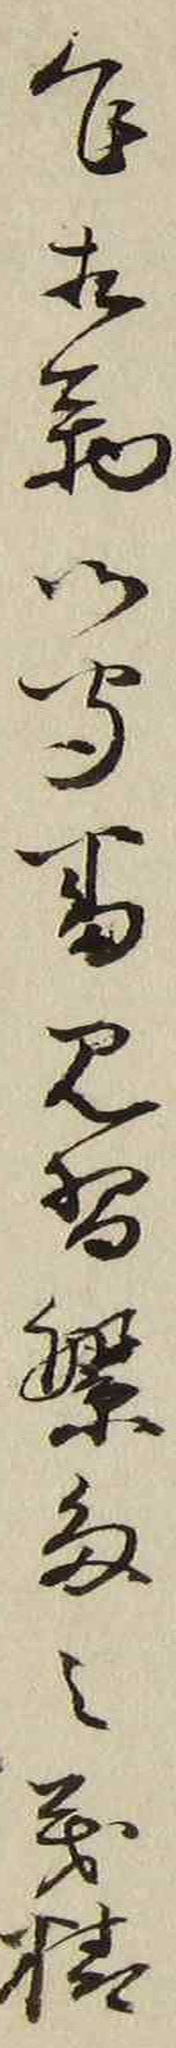乍相勤御守番見習繁多之義精
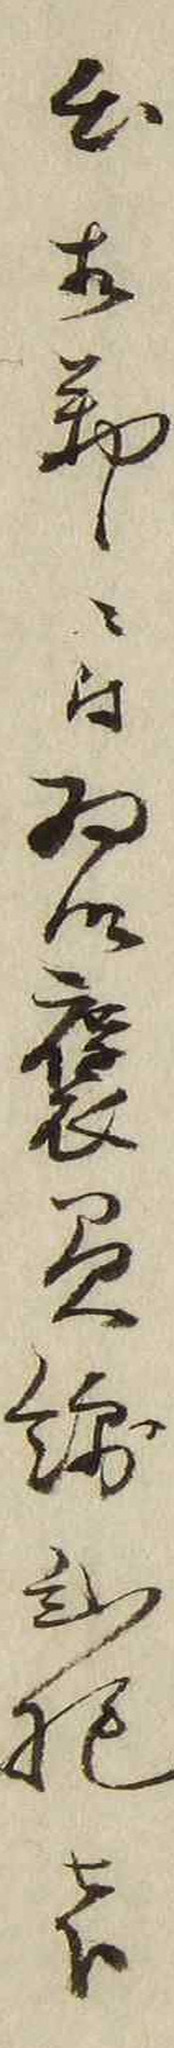出相勤候に付為御褒美綿弐把被下

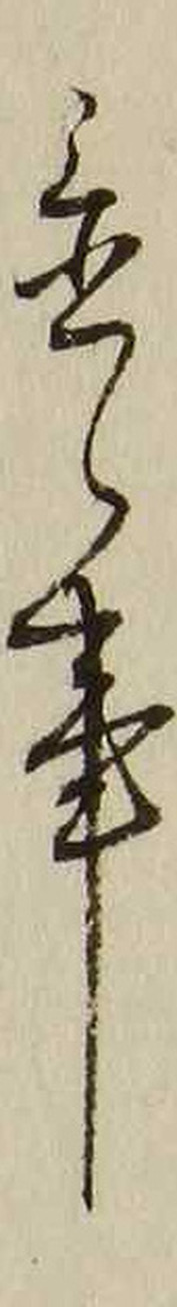置候事
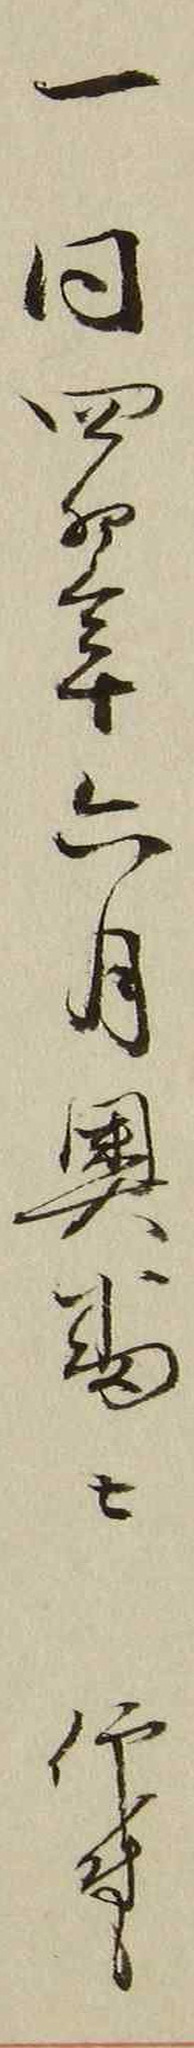一同四卯年六月奥番被仰付候
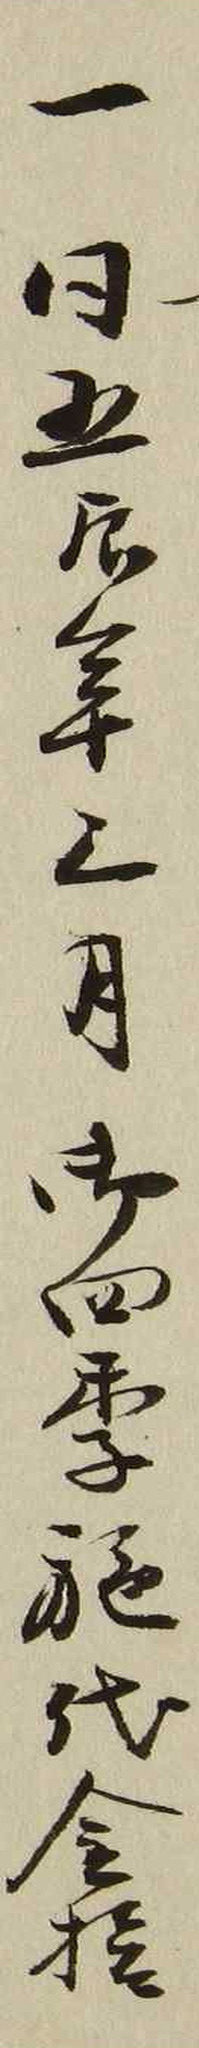一同五辰年三月御四季施金拾
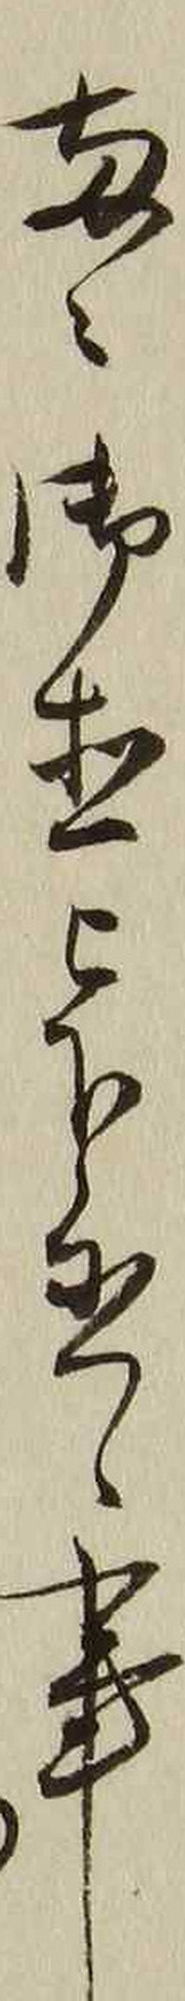両に御直被下置候事
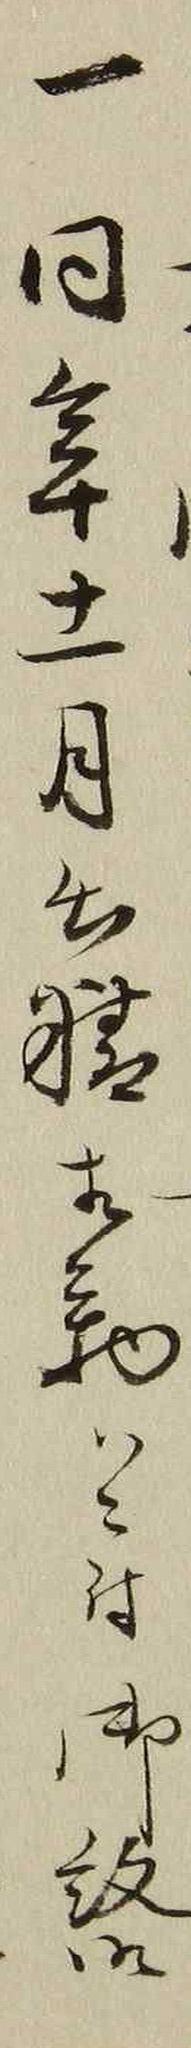一同年十一月出精相勤候に付御紋御
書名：諸士系譜　巻之292　き之部1
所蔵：会津若松市立会津図書館
